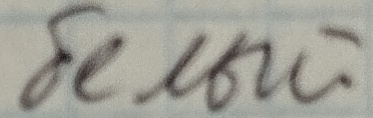белый
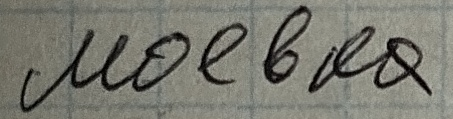моевка
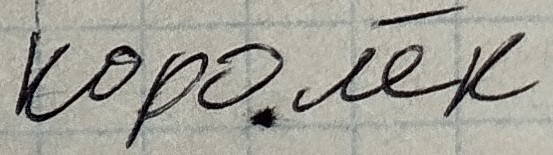королёк
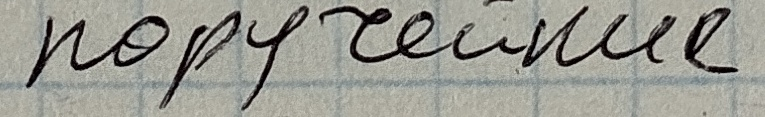поручейник
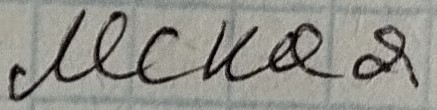лесная
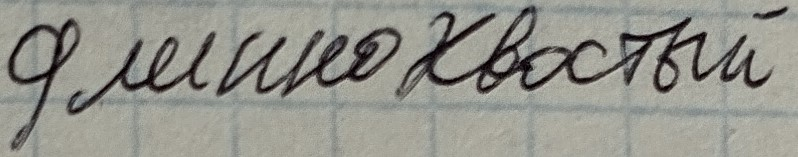длиннохвостый
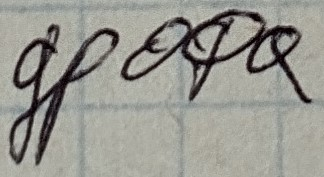дрофа
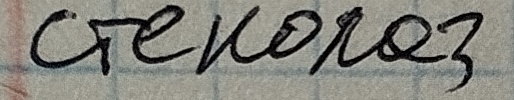стенолаз
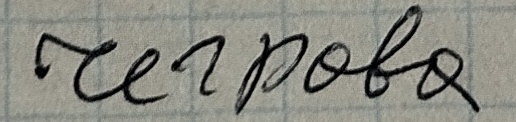чеграва
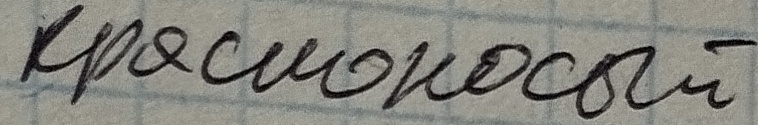красноносый
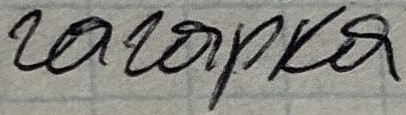гагарка
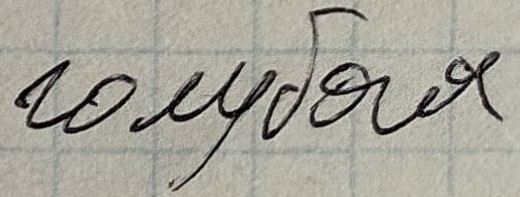голубяя
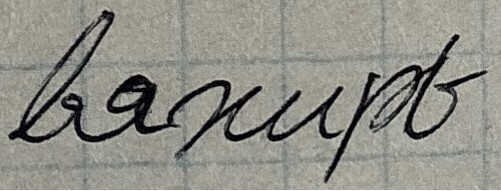вяхирь
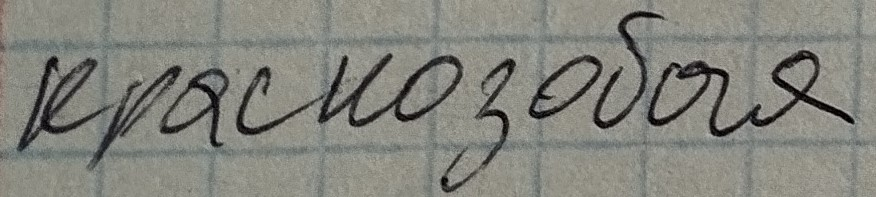краснозобая
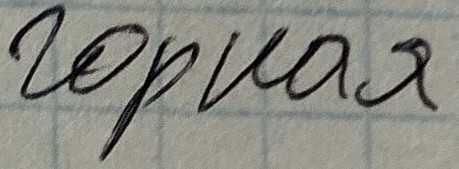горная
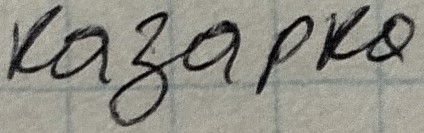казарка
